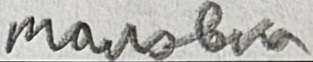таловка
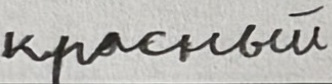красный
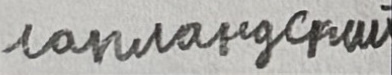лапландский
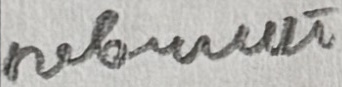певчий
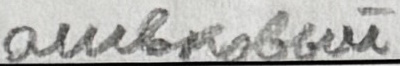оливковый
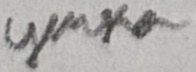утка
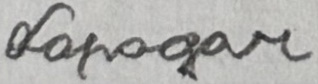бородач
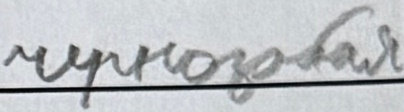чернозобая
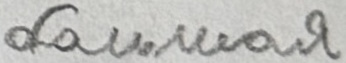большая
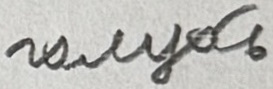голубь
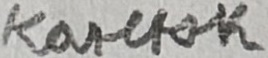канюк
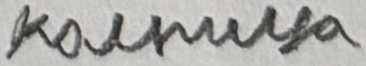колпица
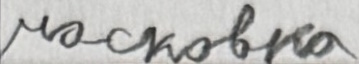московка
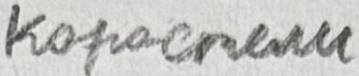коростель
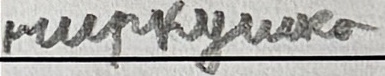тиркушка
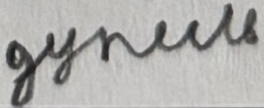дупель
